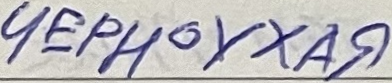черноухая
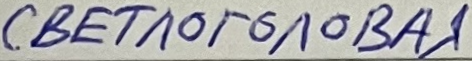светлоголовая
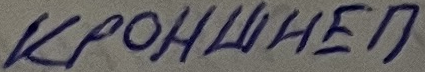кроншнеп
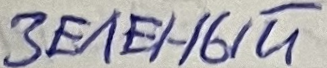зеленый
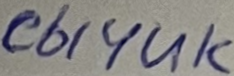сычик
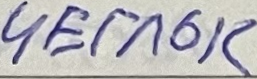чеглок
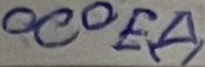осоед
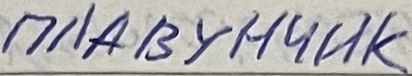плавунчик
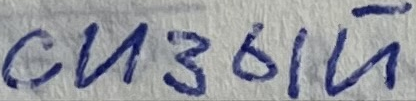сизый
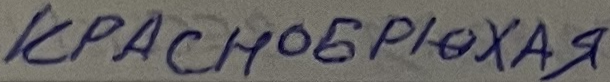краснобрюхая
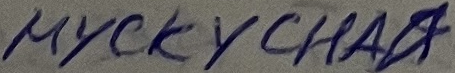мускусная
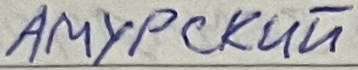амурский
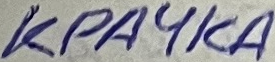крачка
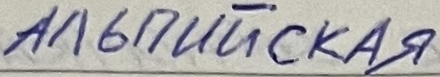альпийская
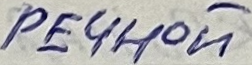речной
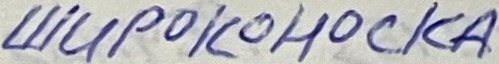широконоска
